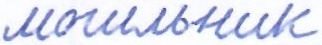могильник
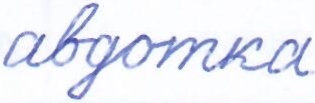авдотка
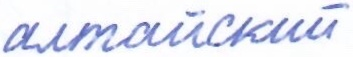алтайский
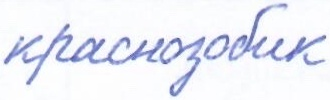краснозобик
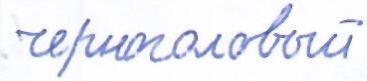черноголовый
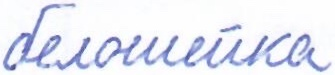белошейка
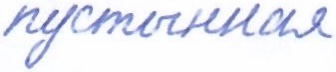пустынная
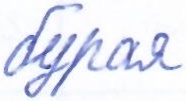бурая
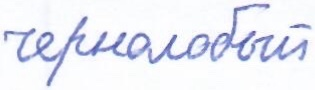чернолобый
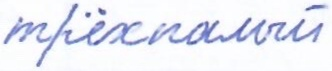трёхпалый
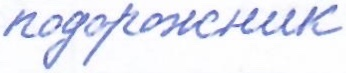подорожник
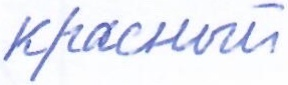красный
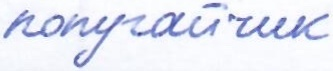попугайчик
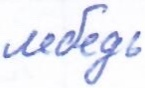лебедь
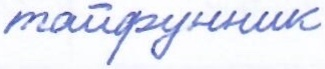тайфунник
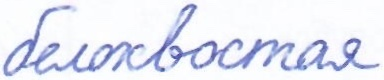белохвостая
